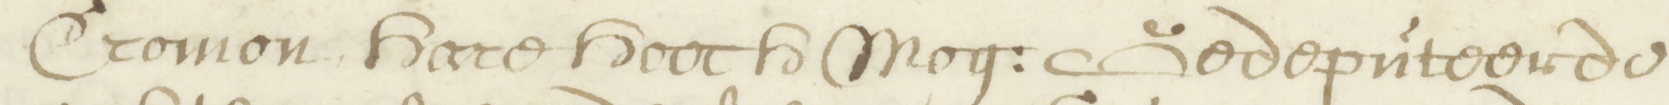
Cromon, hare Hooch Mog: Gedeputeerde
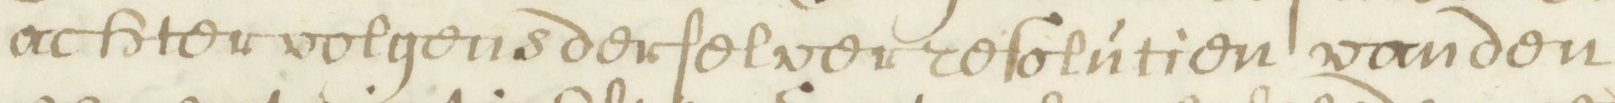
achtervolgens derselver resolutien vanden
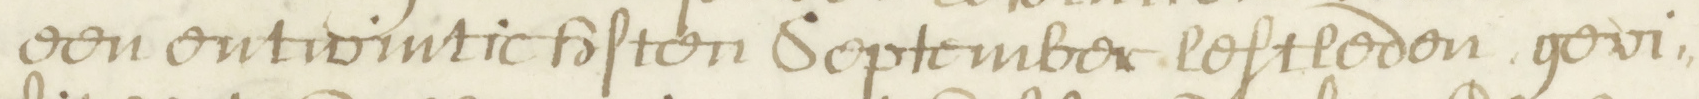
een entwintichsten September lestleden, gevi„
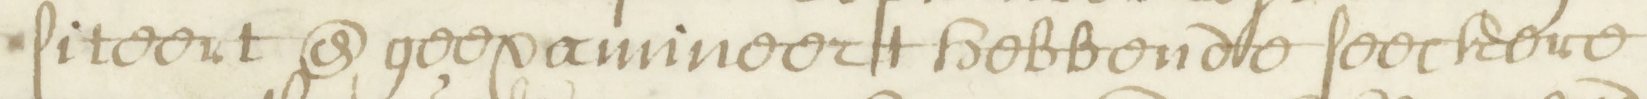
siteert & geexamineert hebbende seeckere
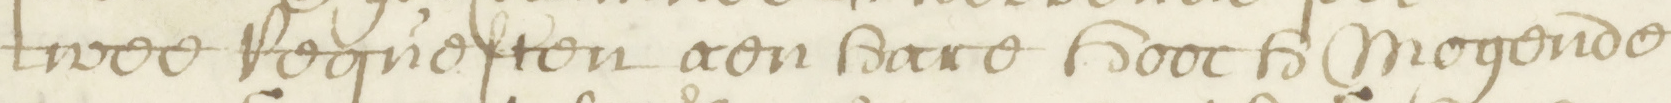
twee Requesten aen hare Hooch Mogende
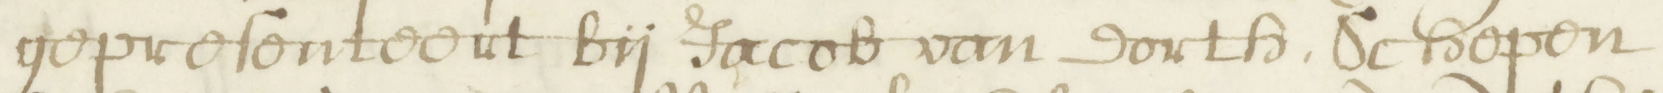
gepresenteert bij Jacob van Dorth, Schepen
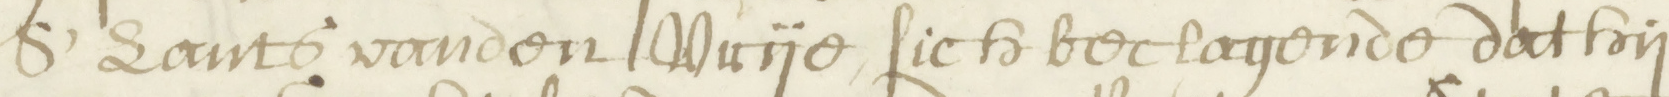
S‛Lants vanden Vrije sich beclagende dat hij
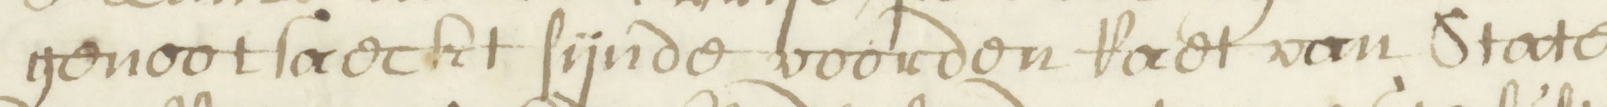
genootsaeckt sijnde voorden Raet van State
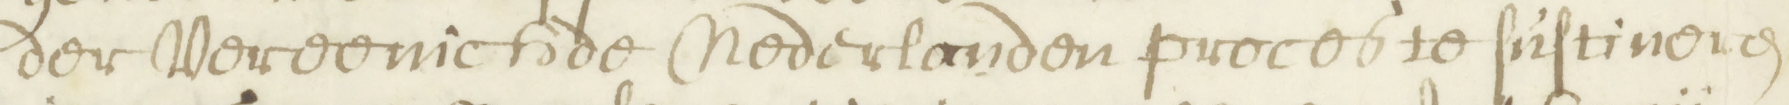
der Vereenichde Nederlanden proces te sustineren
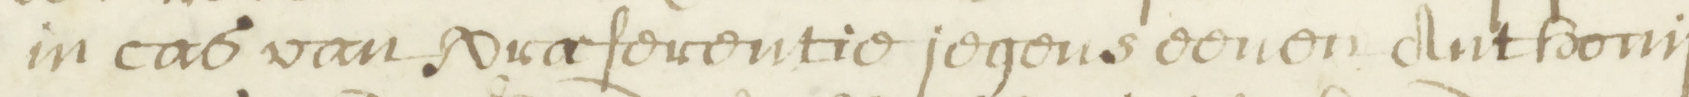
in cas van præferentie jegens eenen Anthonij
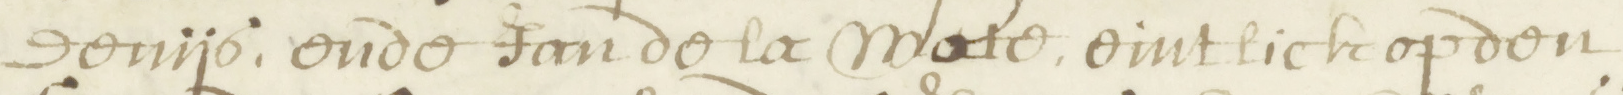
Denijs, ende Jan de la Mote, eintlick opden
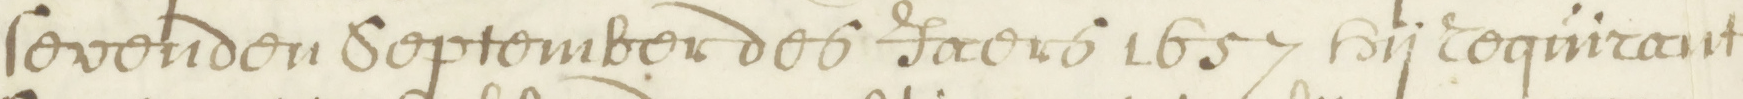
sevenden September des Jaers 1657 hij requirant
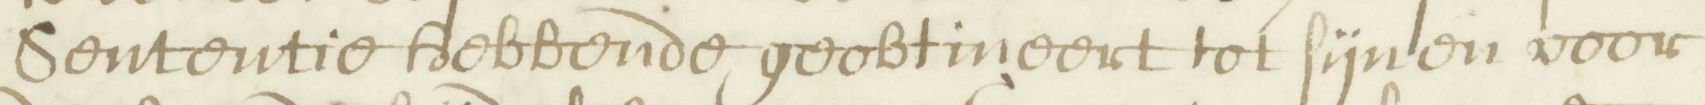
Sententie hebbende geobtineert tot sijnen voor
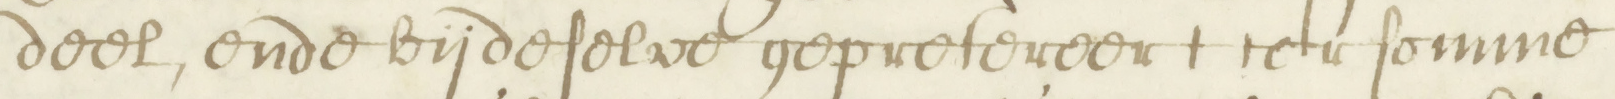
deel, ende bij deselve geprefereert ter somme
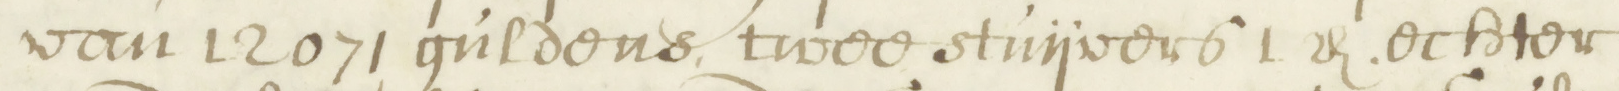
van 12071 guldens, twee stuijvers 1 p. echter
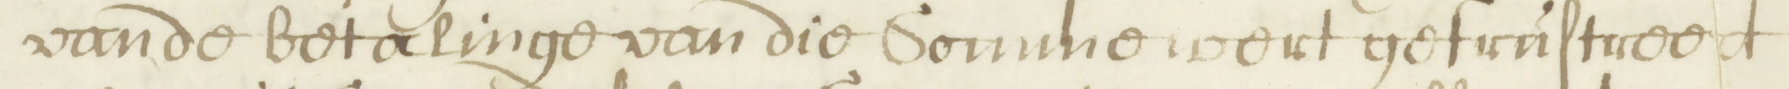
vande betalinge van die Somme wert gefrustreert
